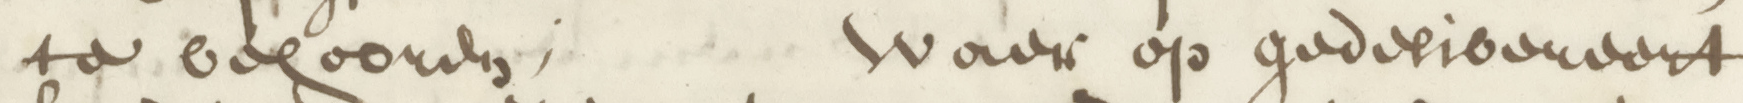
te behooren; Waer op gedelibereert
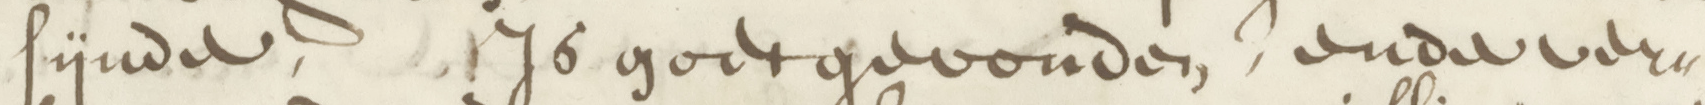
sijnde, Is goetgevonden, ende ver„
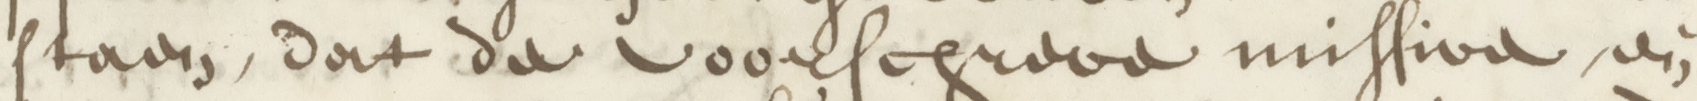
„staen, dat de voorschreve missive, en
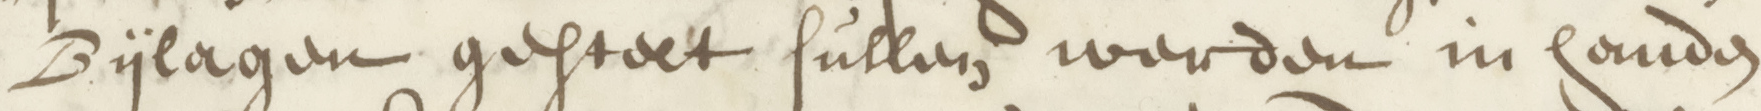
Bijlagen gestelt sullen werden in handen
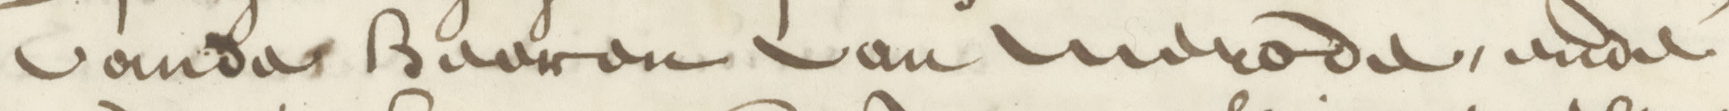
vanden heeren van Merode, ende
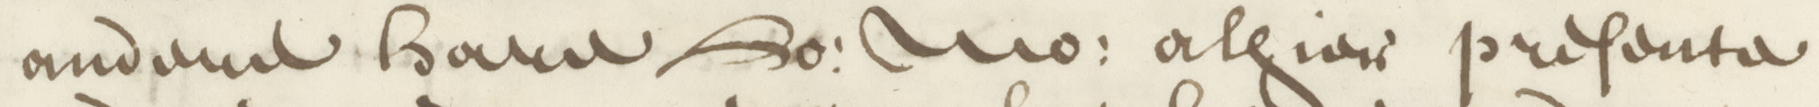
andere hare Ho:Mo: alhier presente
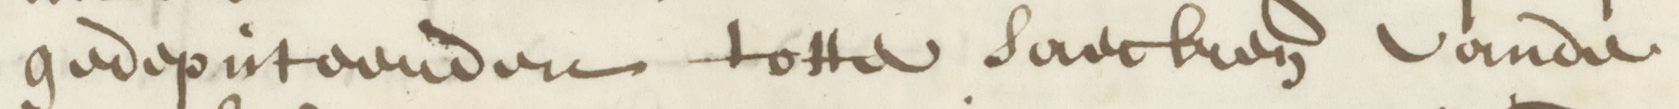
gedeputeerden totte saecken vande
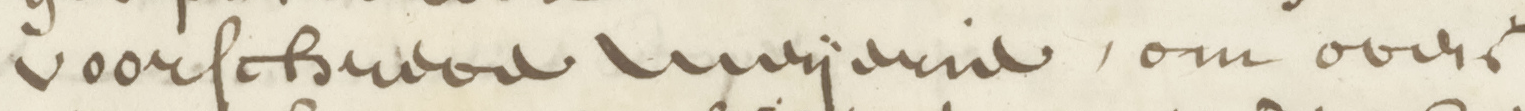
voorschreve Meijerie, om over
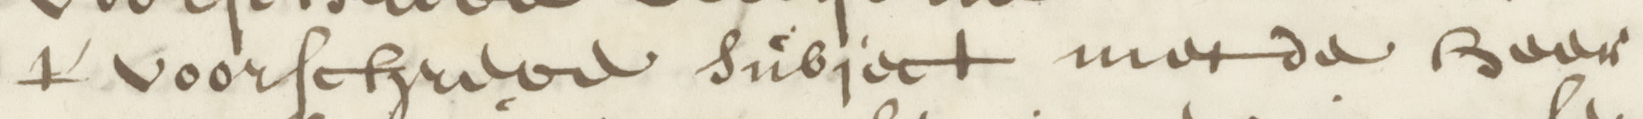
t' voorschreve subject met de heer
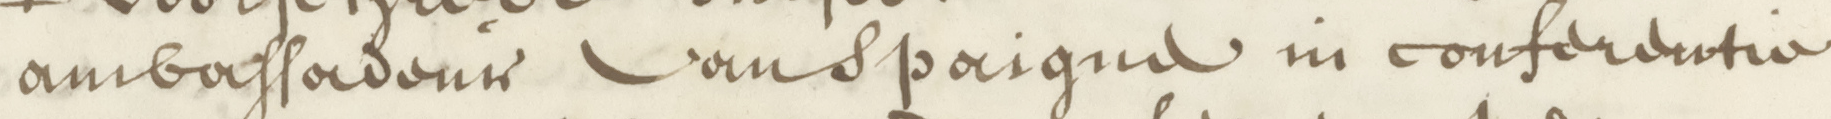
ambassadeur van spaigne in conferentie
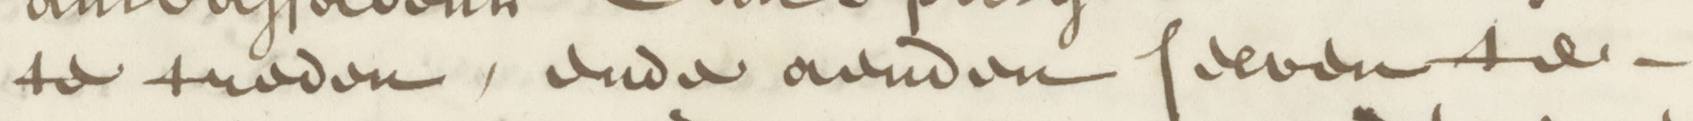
te treden, ende aenden selven te
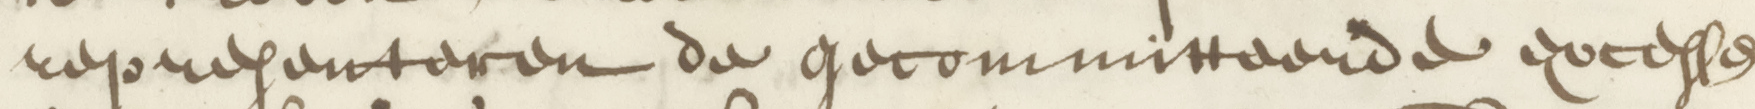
representeren de gecommitteerde excessen
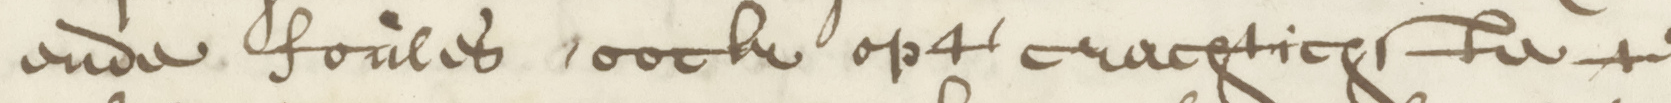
ende foules, oock opt‛ crachtichste te
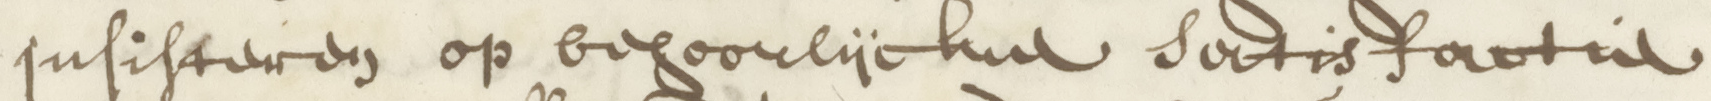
Insisteren op behoorlijcke satisfactie
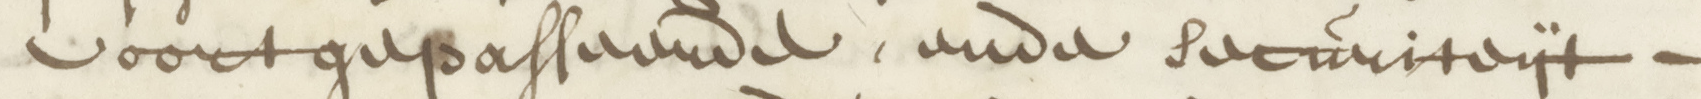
voort gepasseerde, ende securiteijt
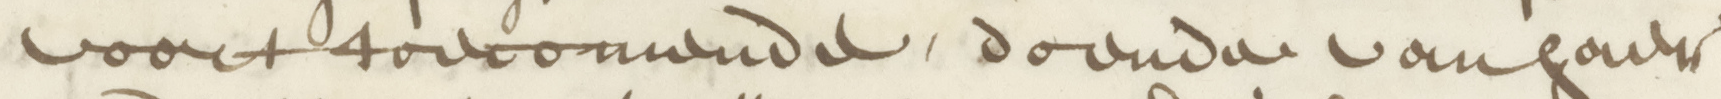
voort toecomende, doende van haer
